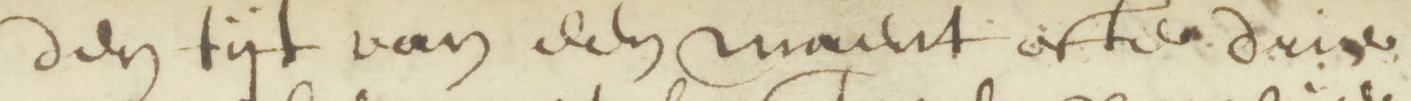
den tijt van een maent ofte drie
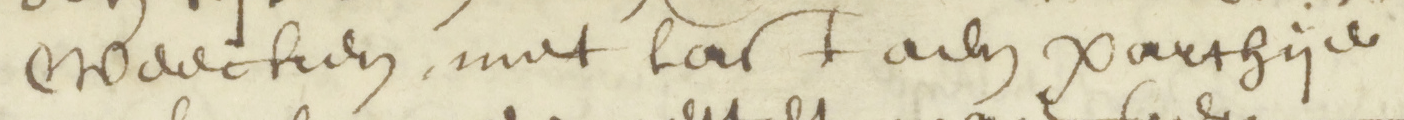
weecken, met last aen parthije
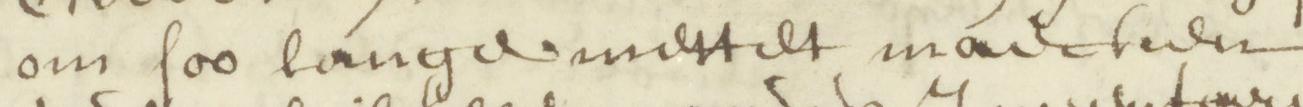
om soo lange mettet maecken
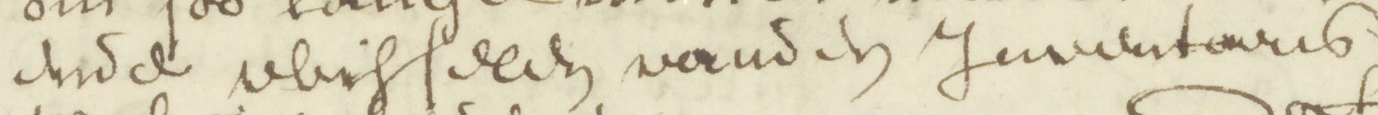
ende wisselen vanden Inventaris
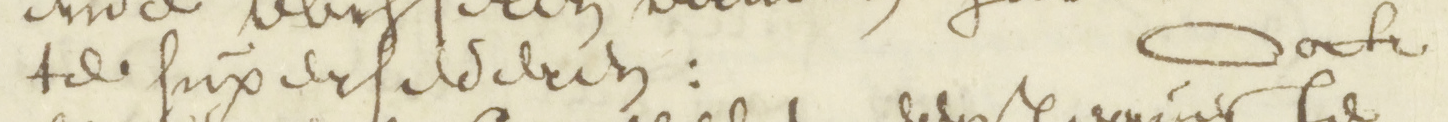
te supersederen: Oock
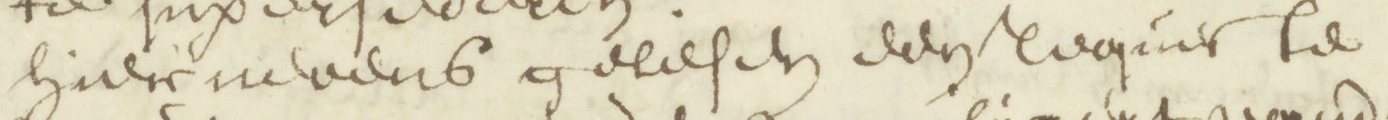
hier nevens gelesen een requeste
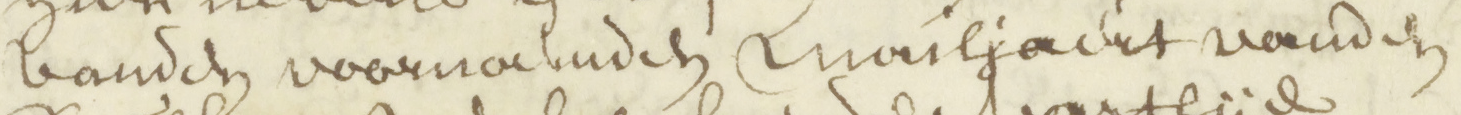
vanden voornoemden Mailjaert vanden
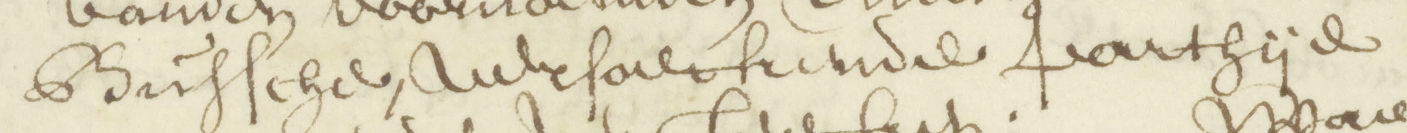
Bussche, versoeckende parthije
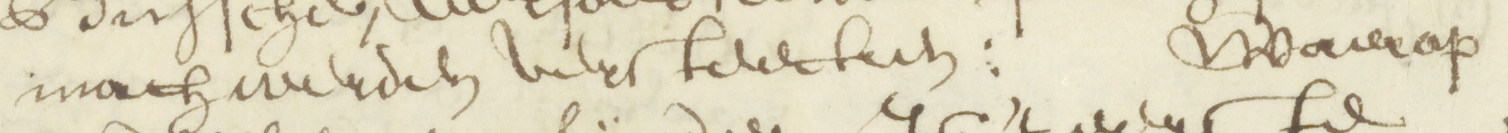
mach werden versteecken: Waerop
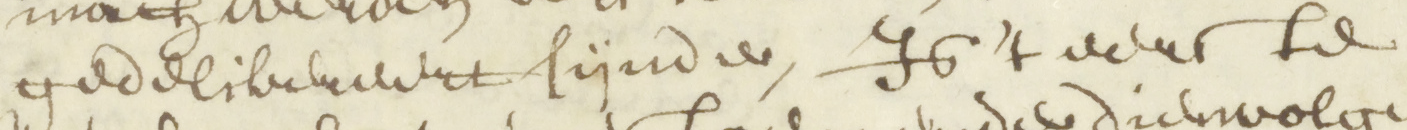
gedelibereert sijnde, Is ‛t eerste
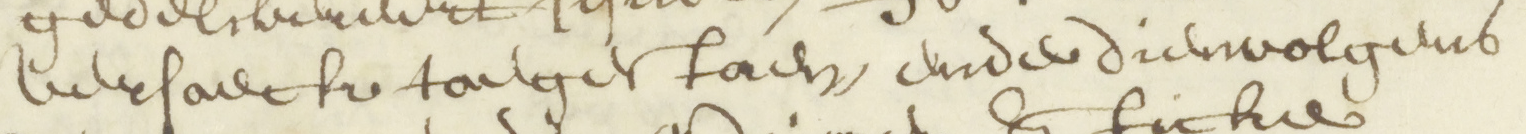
versoeck toegestaen, ende dienvolgens
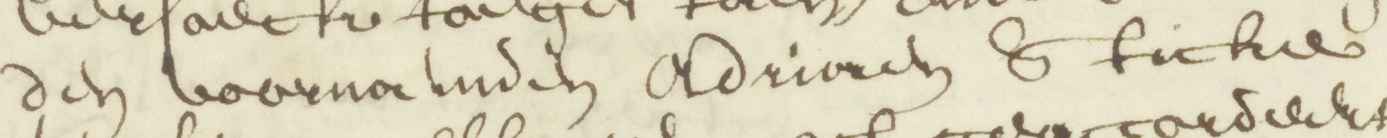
den voornoemden Adriaen Sticke
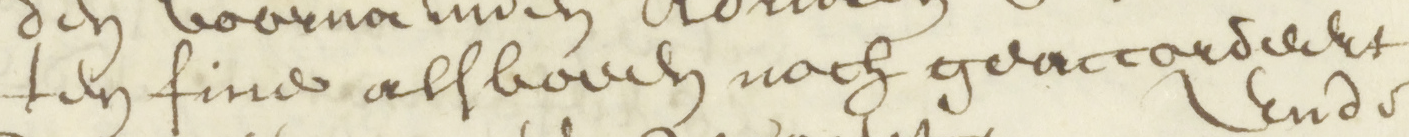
ten fine, alsboven noch geaccordeert
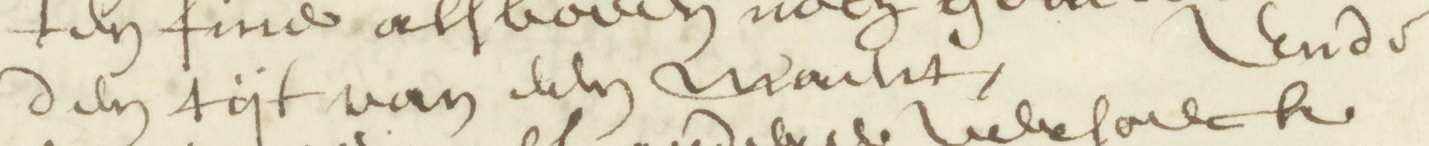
den tijt van een maent. Ende
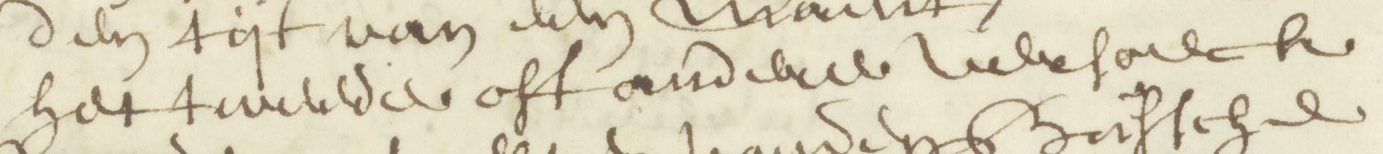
het tweede oft andere versoeck
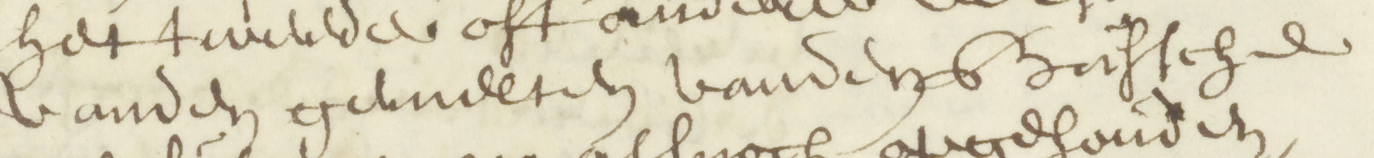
vanden gemelten vanden Bussche
